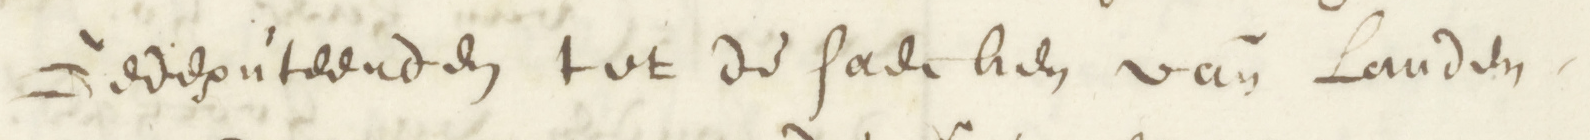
Gedeputeerden, tot de saecken van Landen
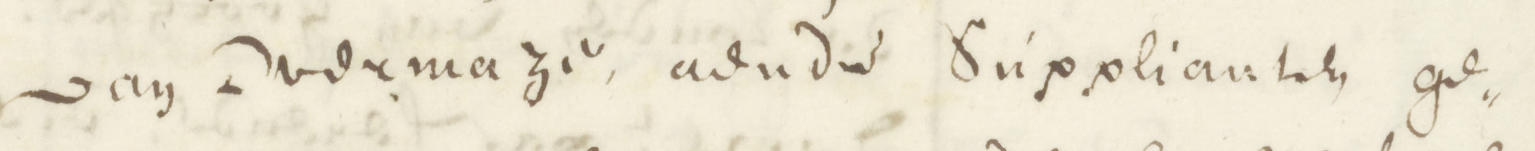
van Overmaze, aende Supplianten ge„
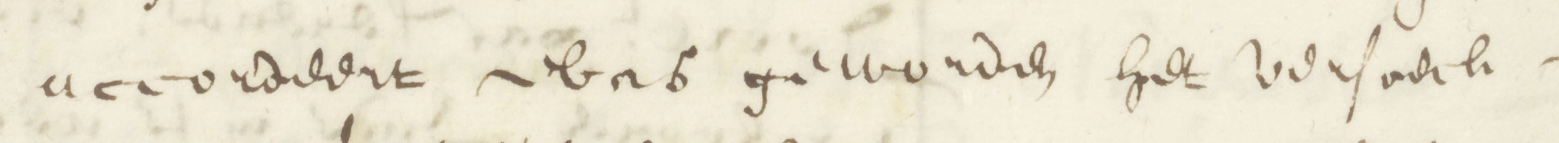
accordeert was geworden het versoeck
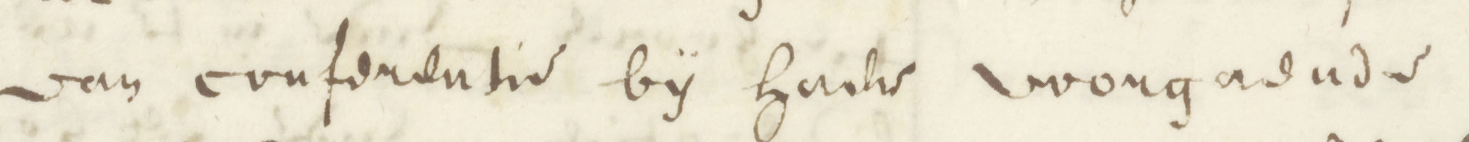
van conferentie bij haer voorgaende
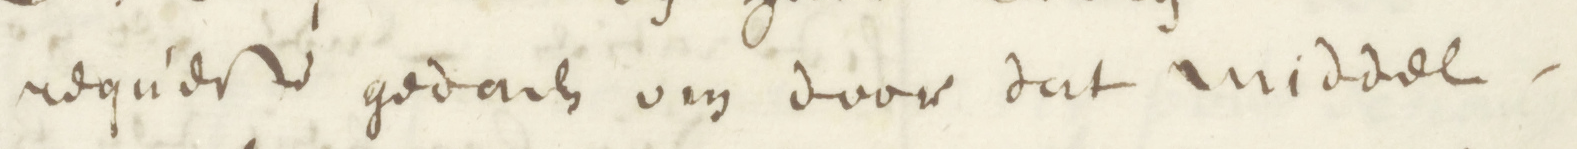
requeste gedaen om door dat middel
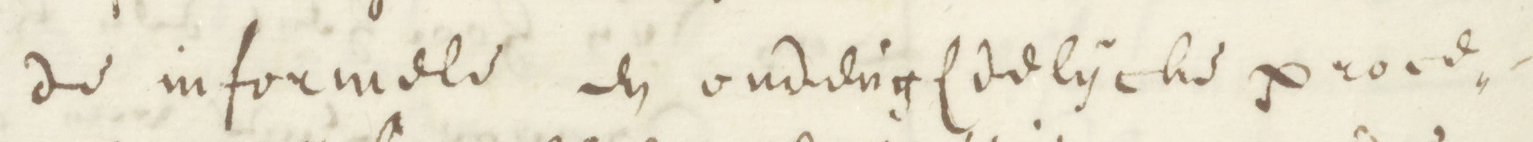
de informele ende ondeughdelijcke proce„
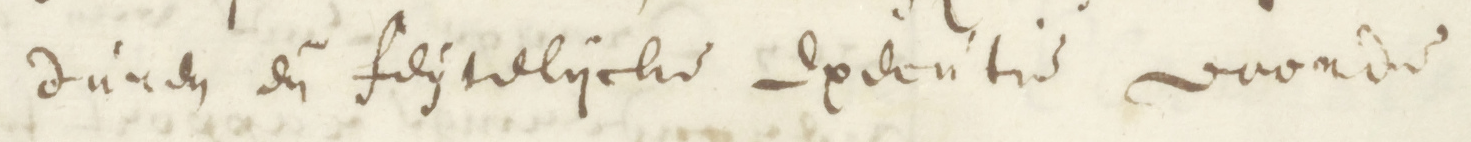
duren ende feijtelijcke executie voorde
